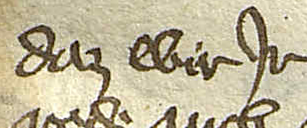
daʒ wir Ir
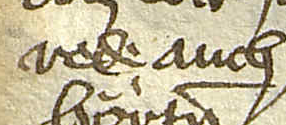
rede auch
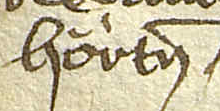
hörtn*
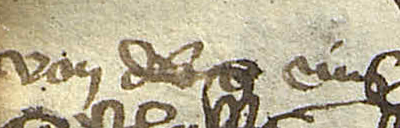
von des g eins
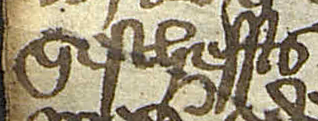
geſcheffts
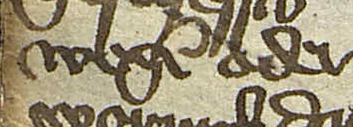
wege* oder
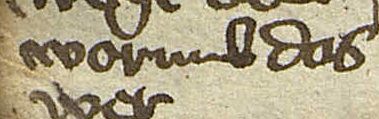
worumb das
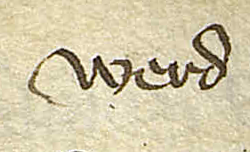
werd
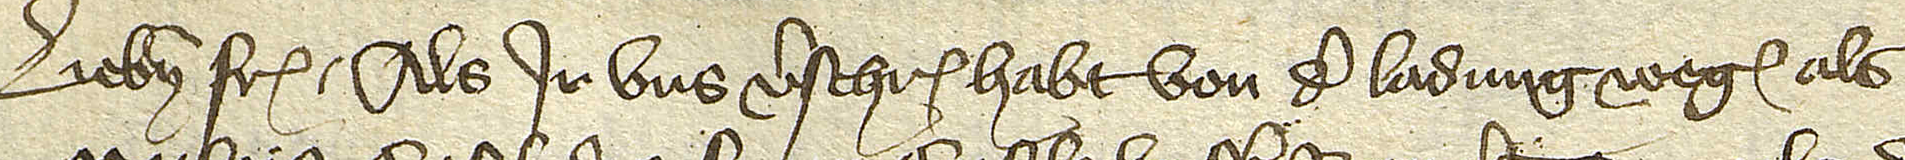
Liebn* fr* / Als Ir vns v*ſchr* habt von d* ladung weg* als
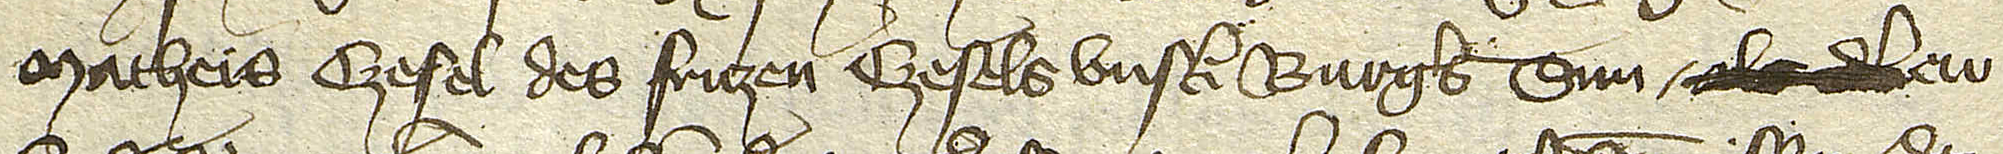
Matheis Cʒeſel des Fricʒen Cʒeſels vnſs* Burgs* Sun / als d* ew
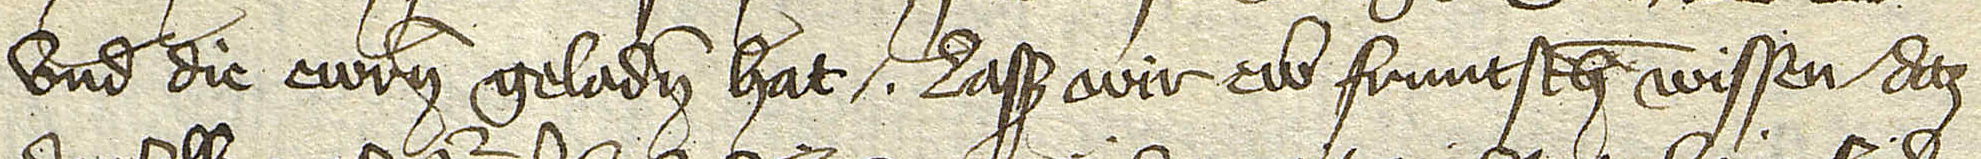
vnd die ewrn* geladn* hat / . Laſſ* wir ew* fruntſch* wiſſen / daʒ
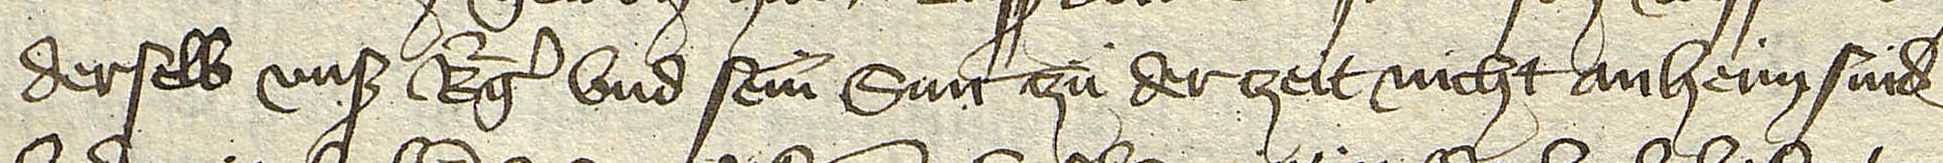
derſelb vnſ* B*g* vnd ſein Sun der cʒeit nicht anheim ſind
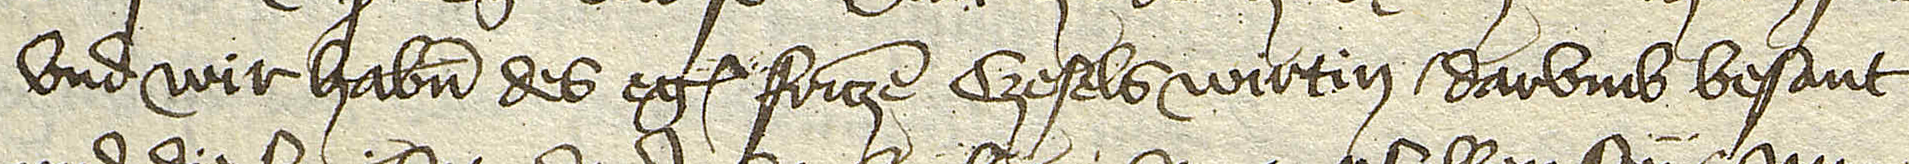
vnd wir habn* eg* fricʒe* Cʒefels wirtin / darvmb beſant
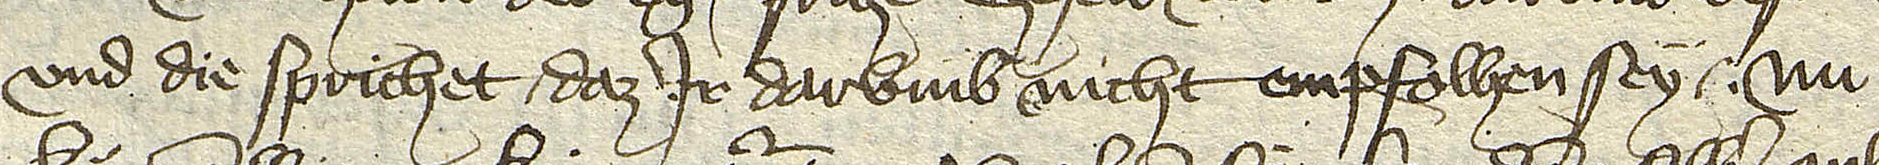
vnd die ſprichet / daʒ Ir darvmb nicht empfolhen ſey / . Nu
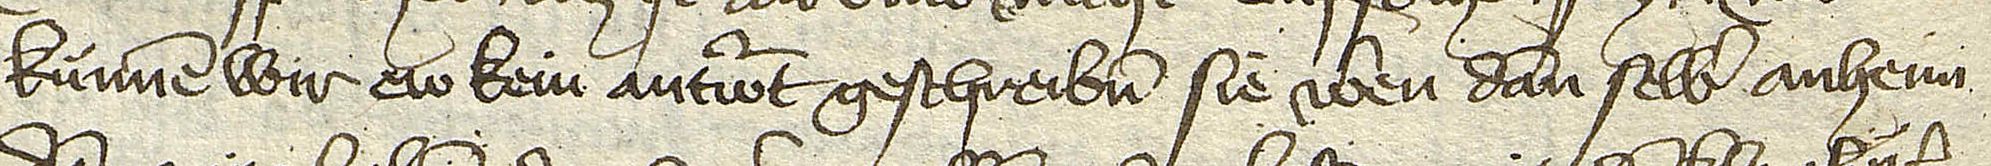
künne* wir ew kein antwt* geſchreibn* ſie w*en dan* ſelb* anheim
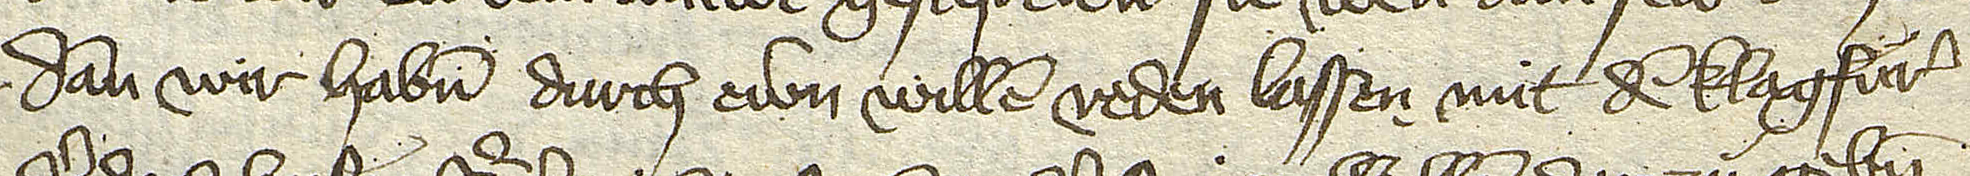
dan* wir habn* durch ew*n wille* reden laſſen mit d* klagfür*
